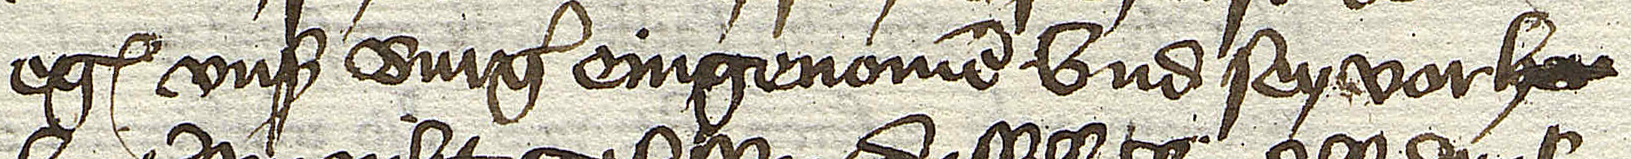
eg* vnſ* Burg* eingenome* vnd ſey vorher
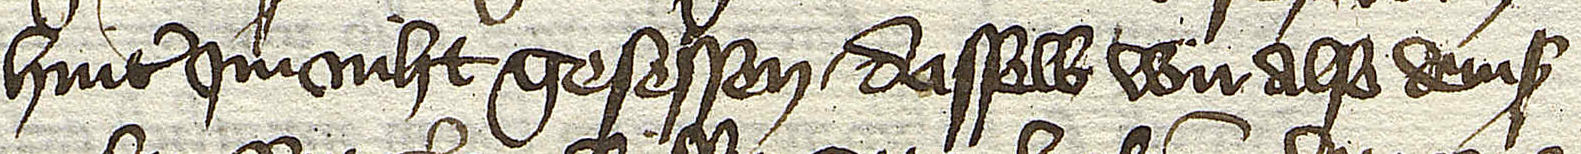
hint* Im niht geſeſſen / daſſelb wir Alſo demſ*
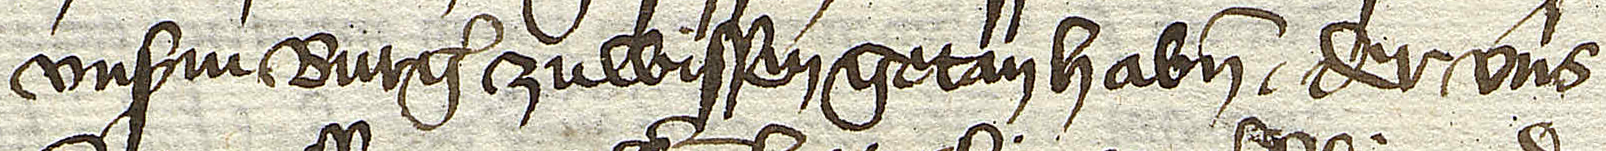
vnſ*m Burg* cʒuwiſſen getan habn* / der vns
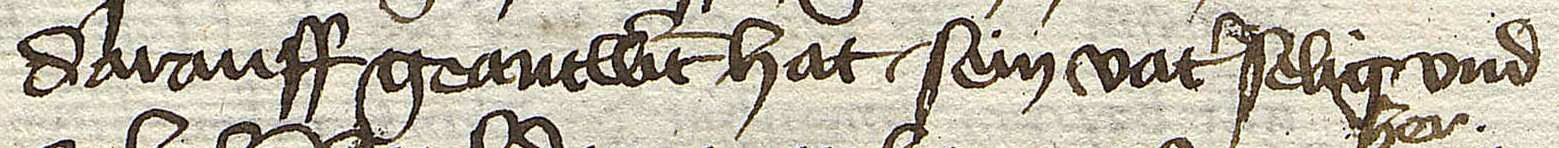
darauff geantw*t hat / ſein vat* ſelig vnd
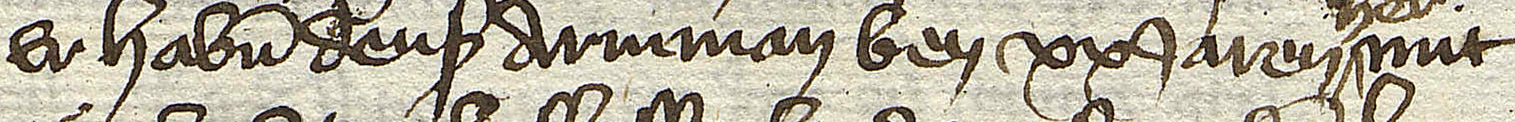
Er habn* denſ* Armman bey xx Iaren mit
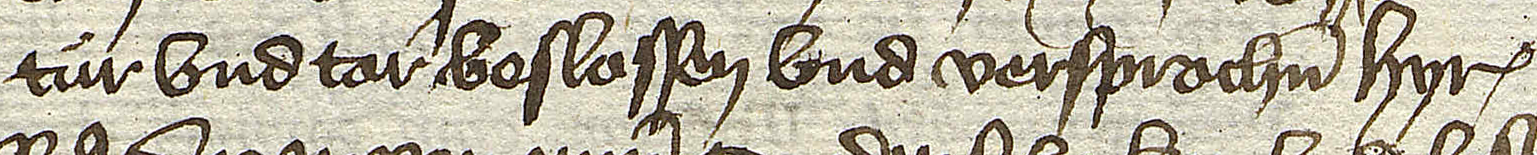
tür vnd tor beſloſſen vnd verſprochn* hyr*
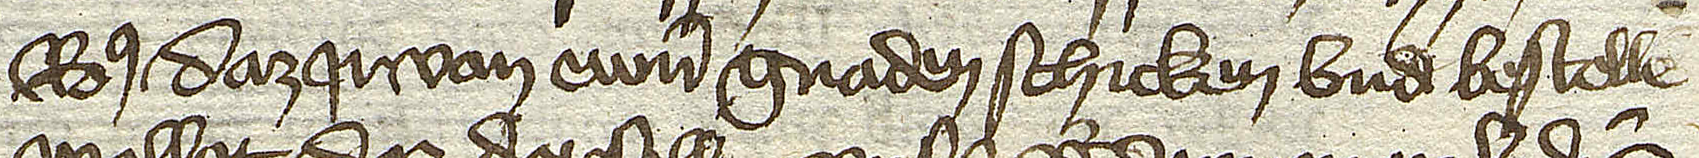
Ro* / Daʒ Ir von ewn* gnaden ſchicken vnd beſtelle*
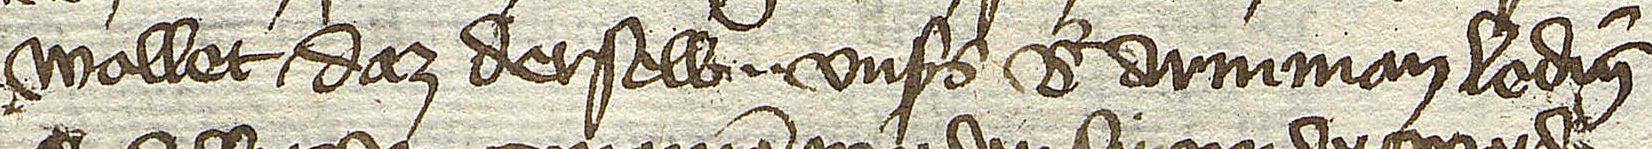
wollet / daʒ derſelb ~ vnſ*s B* Armman ledig
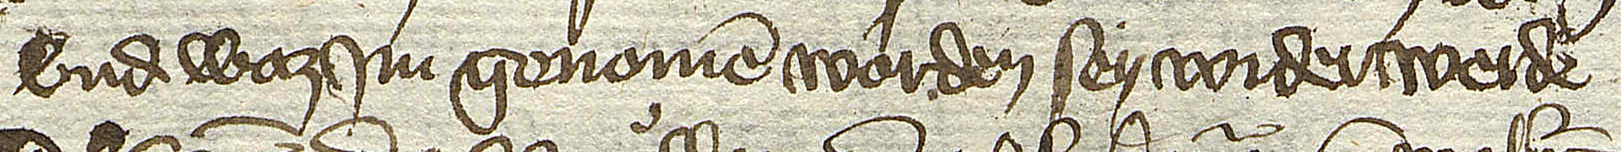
vnd waʒ Im genome* worden ſey wider werde
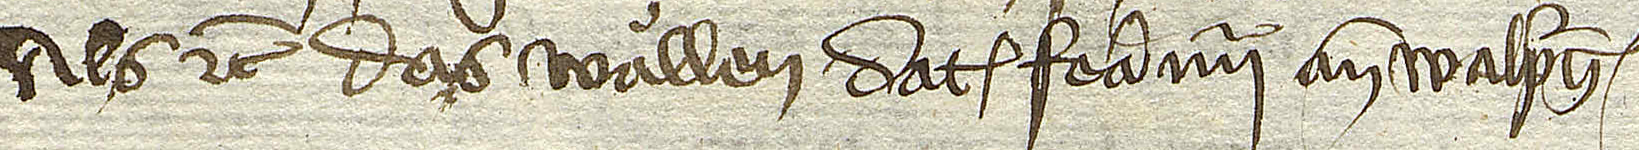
Als ec* das wöllen / Dat* fea* iiii* an* walp*g*
